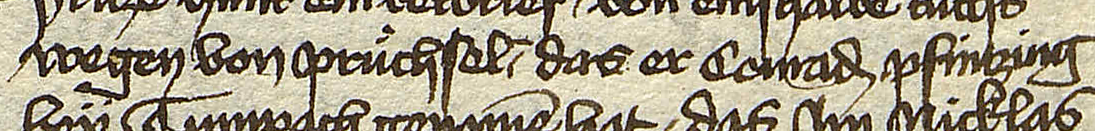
wegen von prüchſel / das er Conrad* pfincʒing
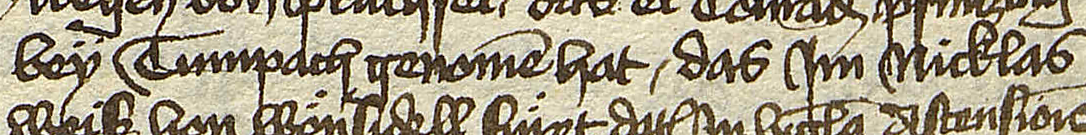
bey Tumpach genome* hat / das Im Nicklas
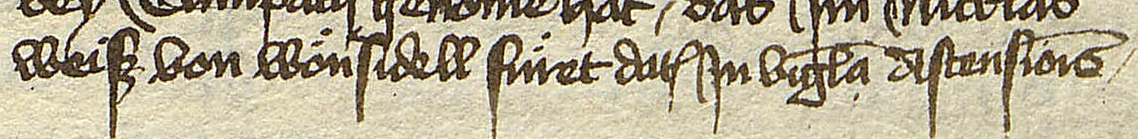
Weiſʒ von wönſidell füret dat* In vigla* Aſcenſions*
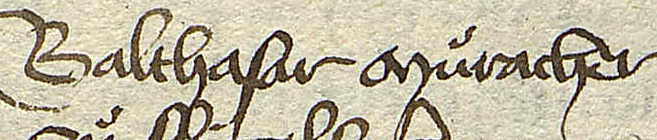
Balthaſar Müracher
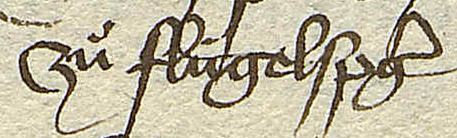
cʒü Flügelſpg*
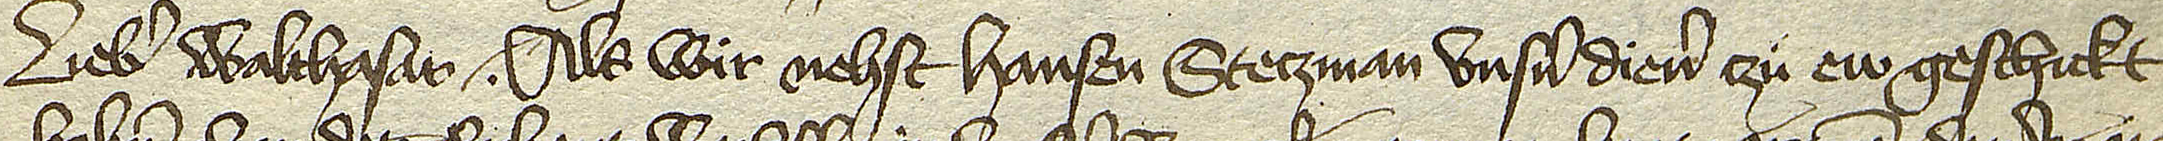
Lieb* Walthaſar / . Als wir nehſt hanſen Stecʒman vnſn* dien* cʒü ew geſchickt
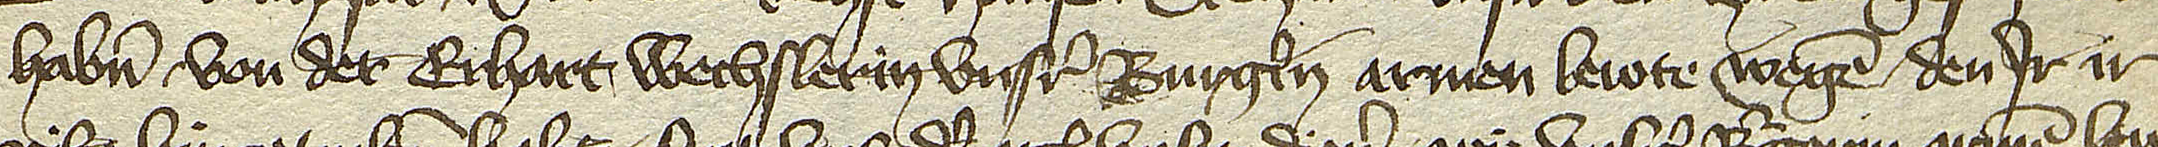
habn* / von der Erhart Wechſlerin vnſr* Burg*in armen lewte wege* / den Ir ir
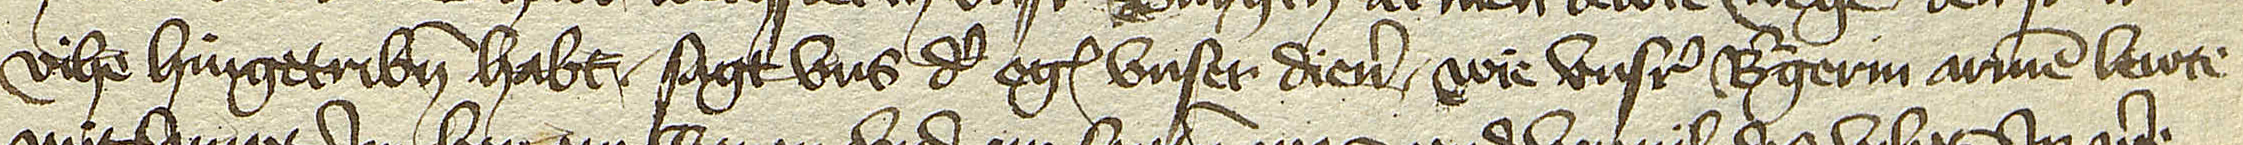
vihe hingetribn* habt / ſagt vns d* eg* vnſer dien* / wie vnſr* B*gerin arme* lewte
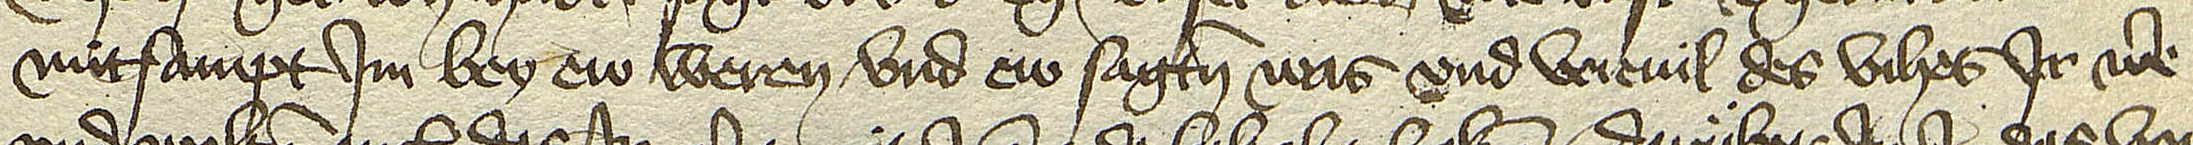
mitſampt Im bey ew weren / vnd ew ſagtn* was vnd wieuil des vihes Ir w*e
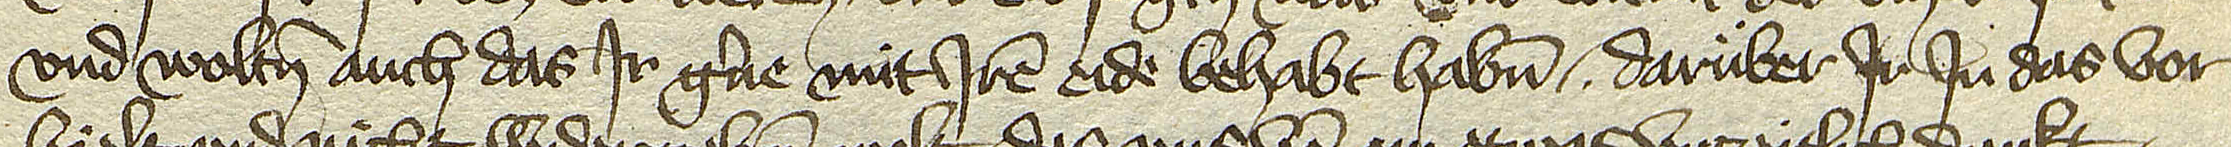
vnd woltn* auch das Ir g*ne mit Ire* eide behabt habn* / . darüber Ir In das vor
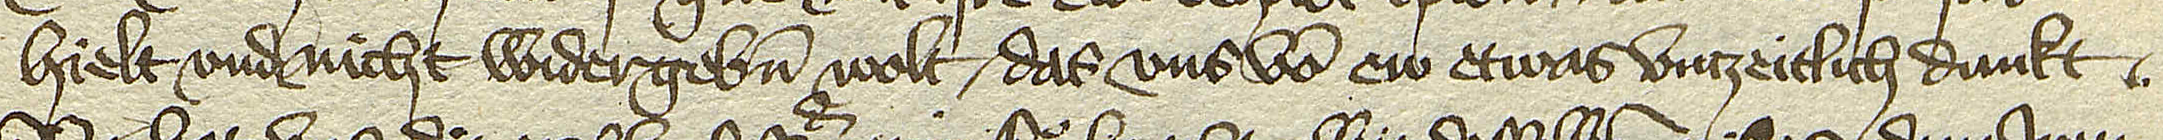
hielt vnd nicht widergebn* wolt / das vns vo* ew etwas vncʒeitlich dunkt / .
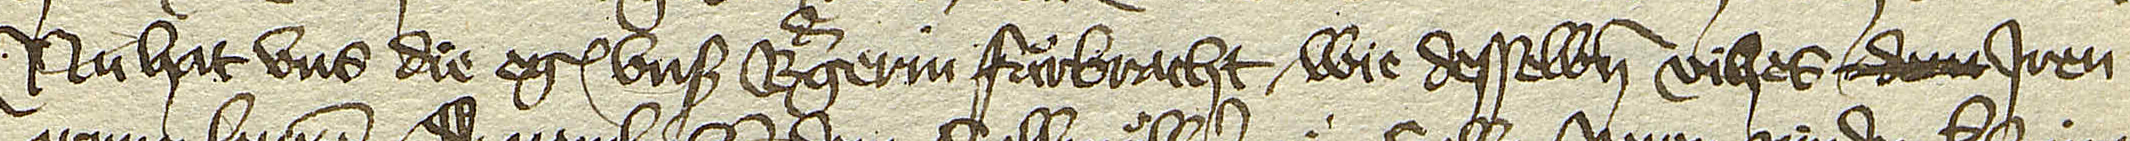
Nu hat vns die eg* vnſ* B*gerin fürbracht / wie deſſelbn* vihes / dem Iren
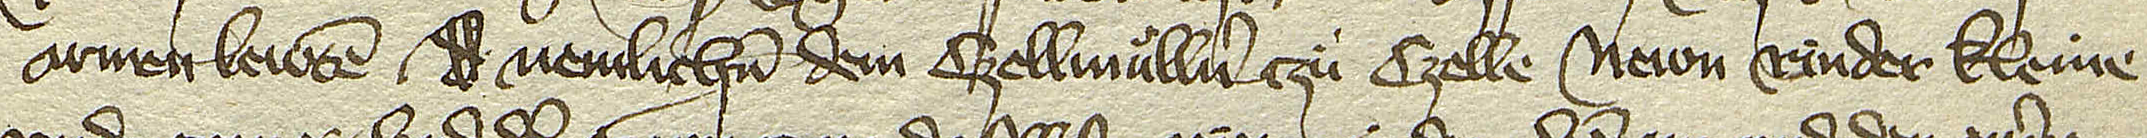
armen lewte* / d nemlichn* dem Cʒellmülln* cʒü Cʒelle Newn rinder kleine
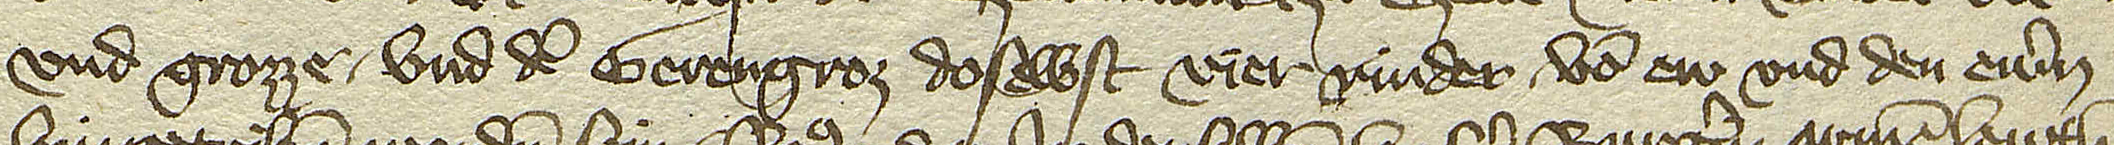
vnd groʒʒe* / vnd d* Gerengroʒ doſelbſt vier rinder / vo* ew vnd den ew*n
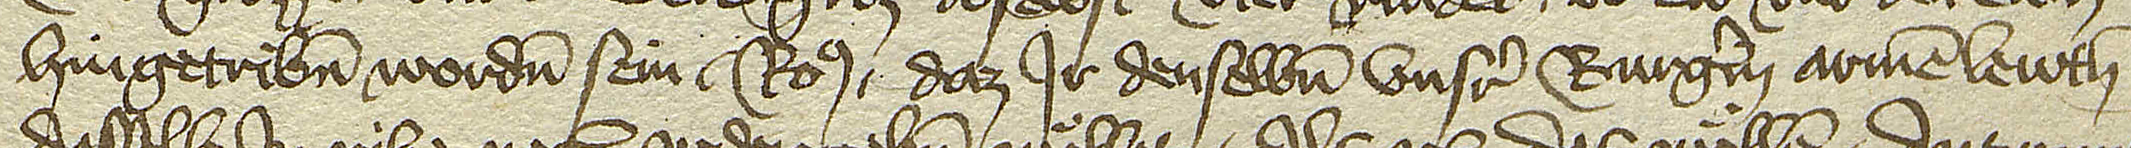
hingetribn* wordn* ſein / Ro* / daʒ Ir denſelbn* vnſr* Burg*in arme* lewtn*
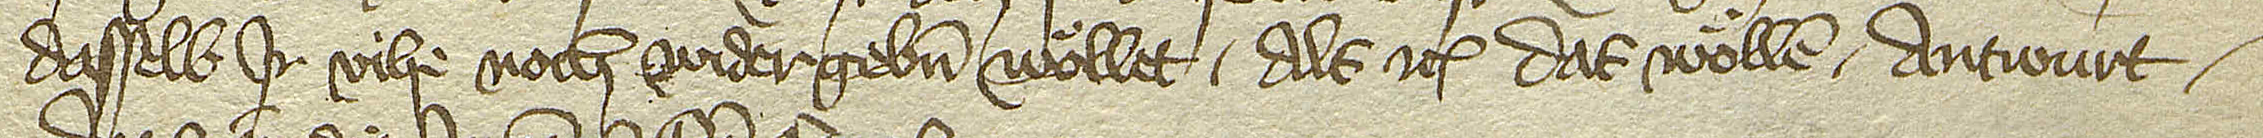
daſſelb Ir vihe noch widergebn* wöllet / Als ec* das wölle* / Antwurt /
